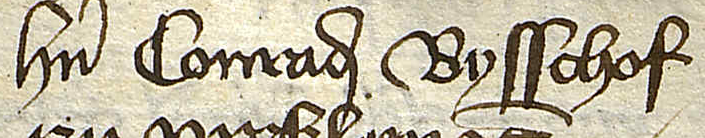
H*n Conrad* Byſſchof
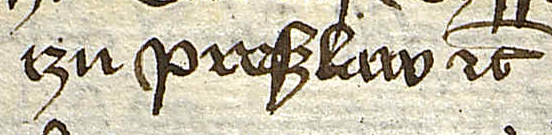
cʒu Preſʒlaw ec*
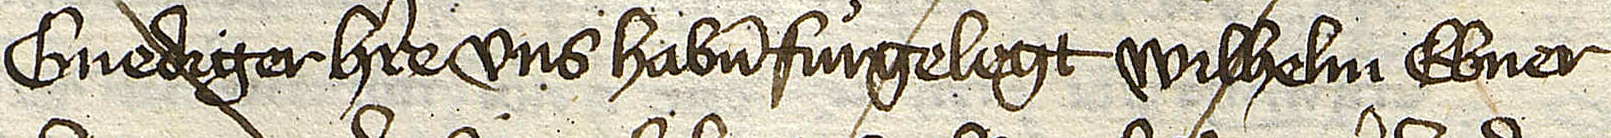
Gnediger h*re vns hab*n fürgelegt wilhelm Ebner
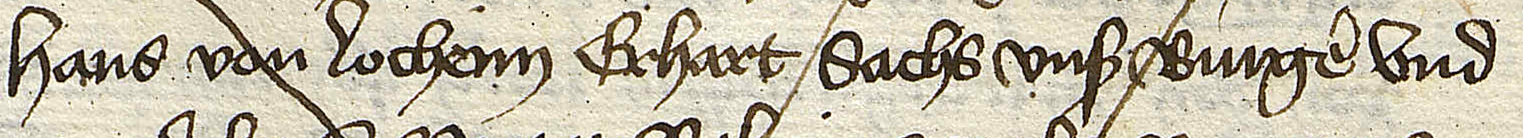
Hans von locheim Erhart Sachs vnſ* Burge* vnd
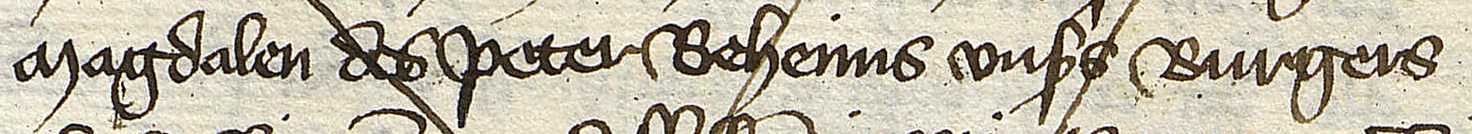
Magdalen des Peter Beheims vnſ*s Burgers
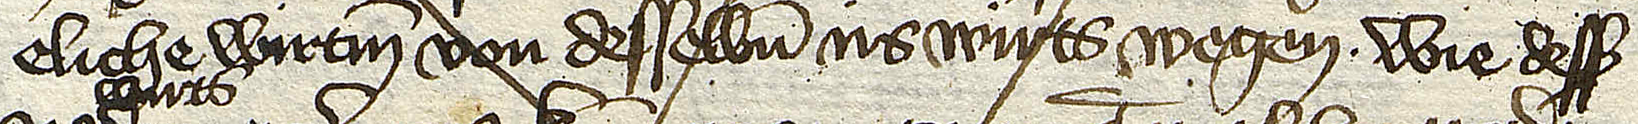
eliche wirtin* von deſſelb*n irs wirts wegen . wie deſſ*
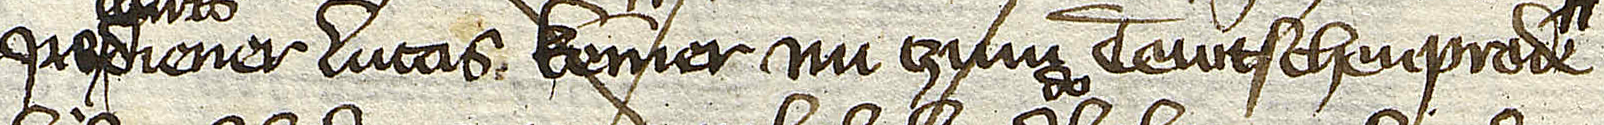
Irs diener Lucas Kem*er nu cʒum Tewtſchenprode
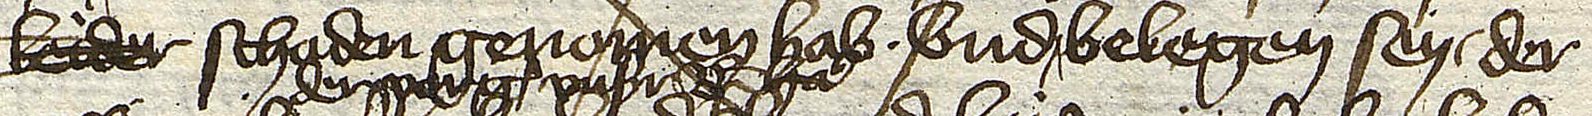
leider ſchaden genomen hab . vnd belegen ſey / der
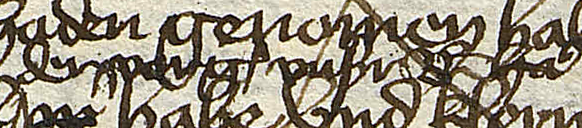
der vorg* vnſ*r B* ha
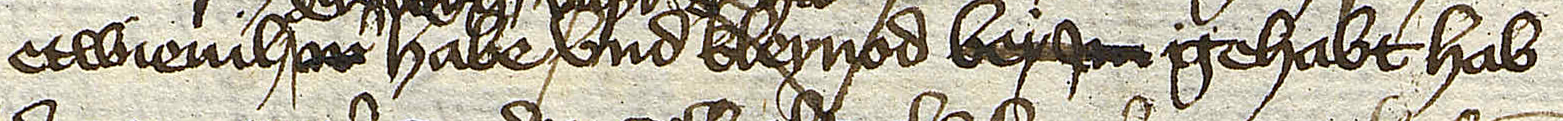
etwieuil ir* habe vnd kleynod bey Im gehabt hab
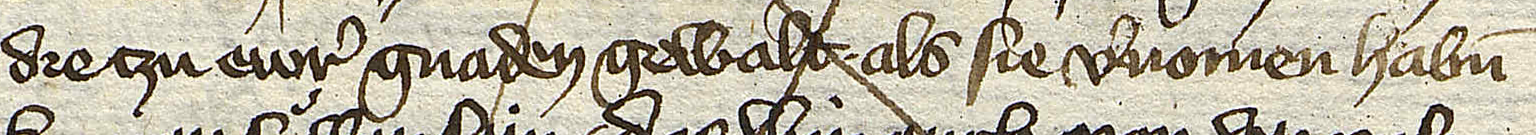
die cʒu ew*r gnaden gewalt . als ſie v*nomen hab*n
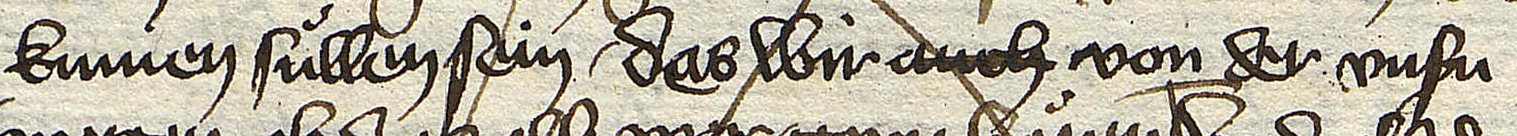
kumen ſüllen ſein / das wir auch von der vnſ*n
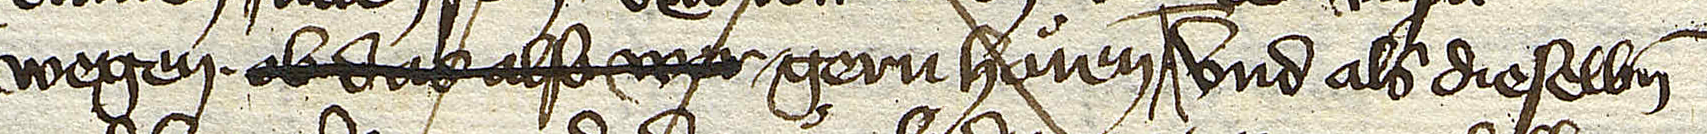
wegen . ob das alſo wer / gern hören vnd als dieſelb*n
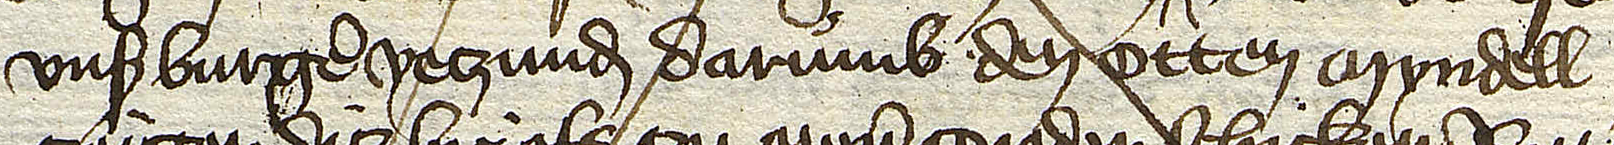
vnſ* burge* yecʒund* darümb . den Otten Myndell
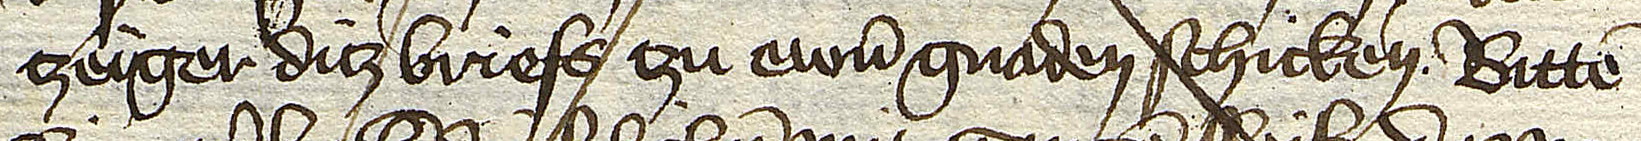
cʒeiger dicʒ briefs cʒu ew*n gnaden ſchicken . Bitte*
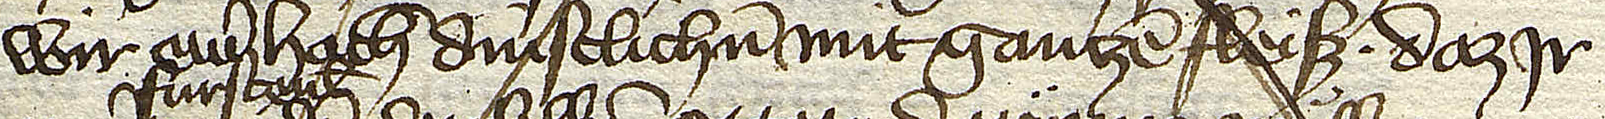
wir ew* hoch* dinſtlich*n mit gancʒe* fleiſʒ . daʒ Ir
